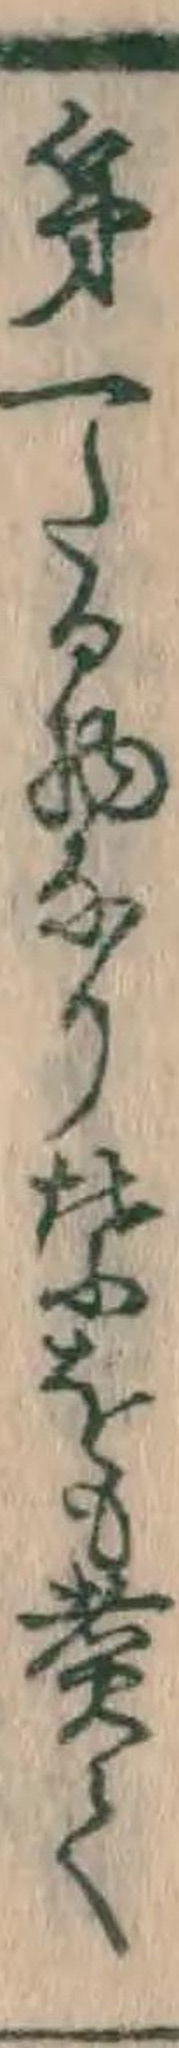第一たる物なり葉をも煮て
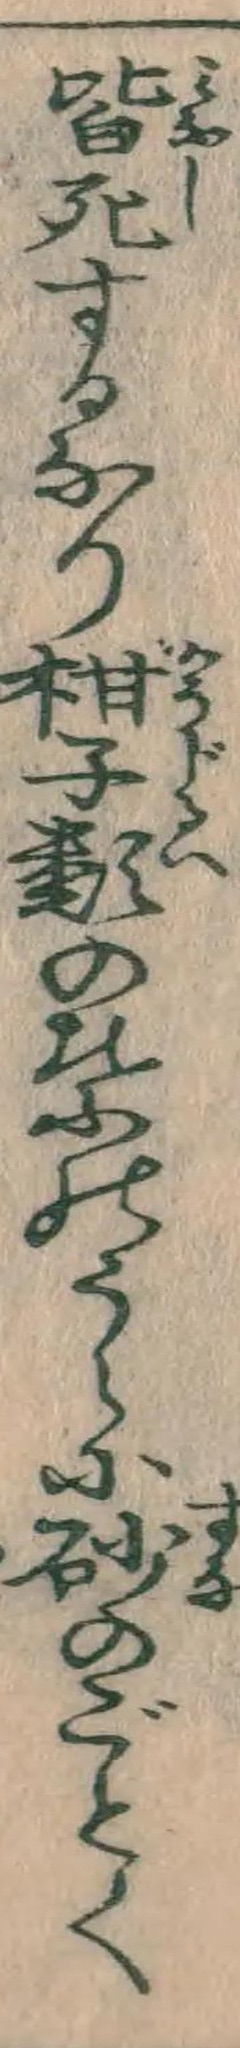皆死するなり柑子類の葉のうらに砂のごとく
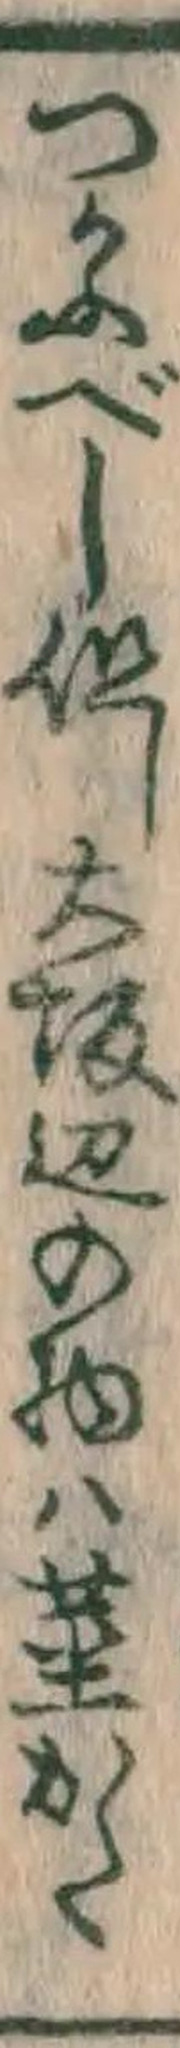つかふべし但し大坂辺の物は茎かた
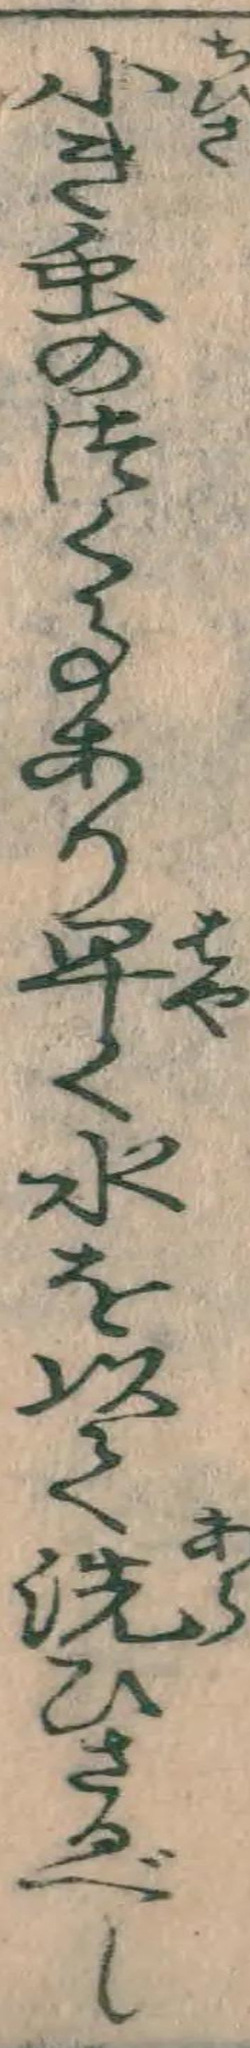小き虫のつく事あり早く水を以て洗ひさるべし
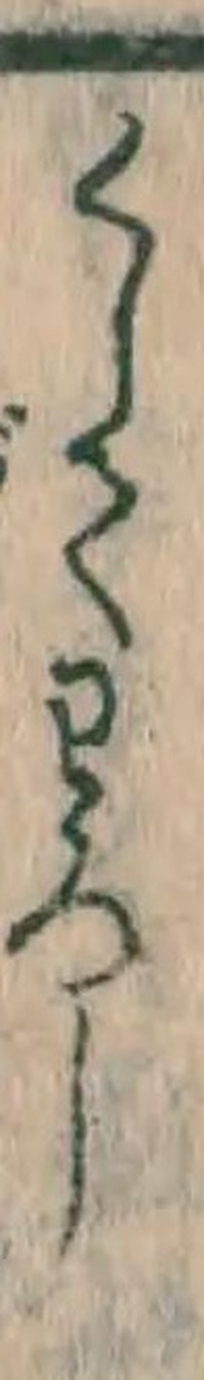くしてわろし
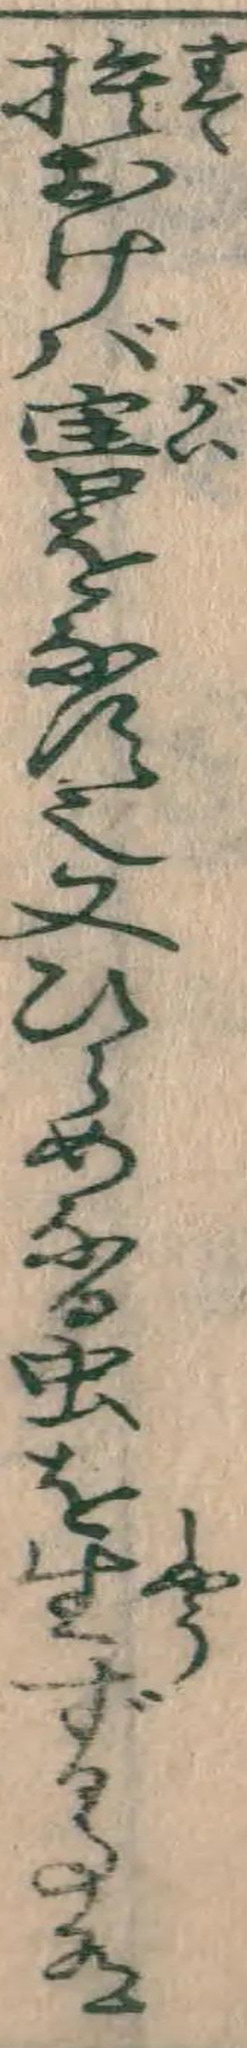捨おけば害をなす也又ひらめなる虫を生ずる事有
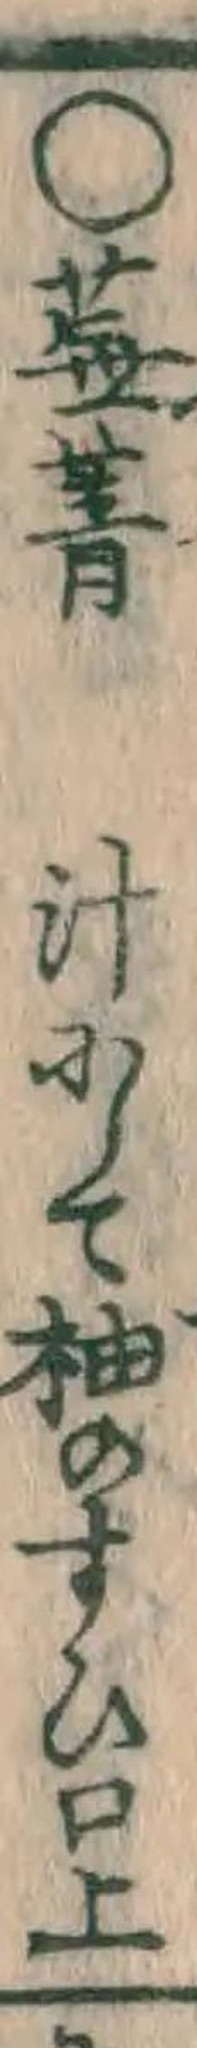○蕪菁汁にして柚のすひ口上
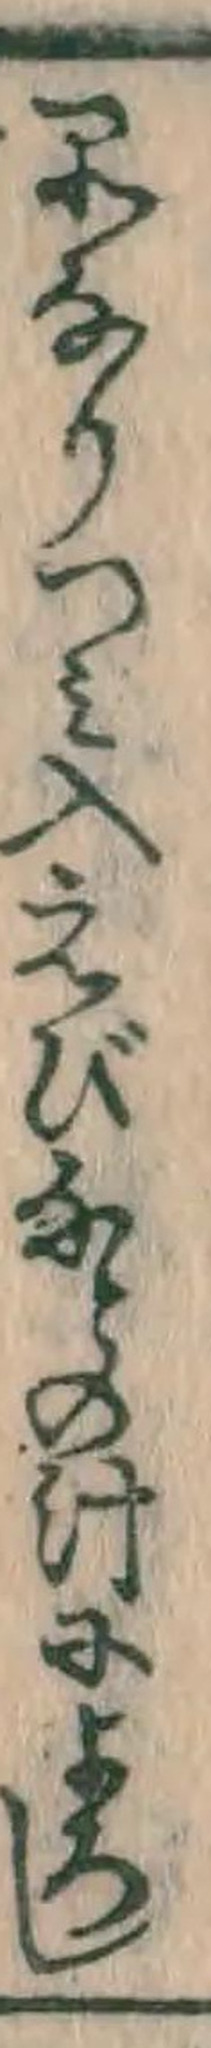品なりつみ入えびなとの汁によろし
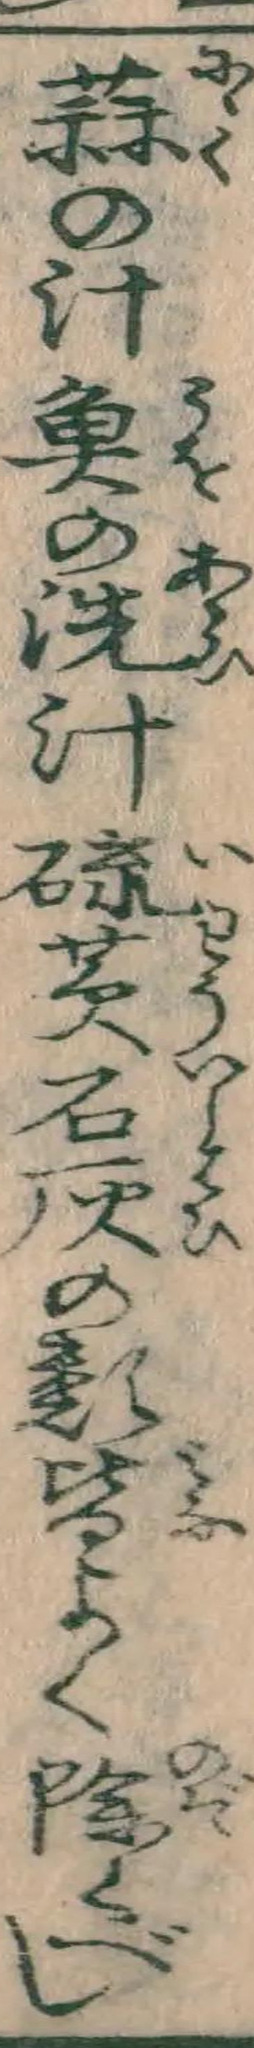蒜の汁魚の洗汁硫黄石灰の類皆よく除くべし
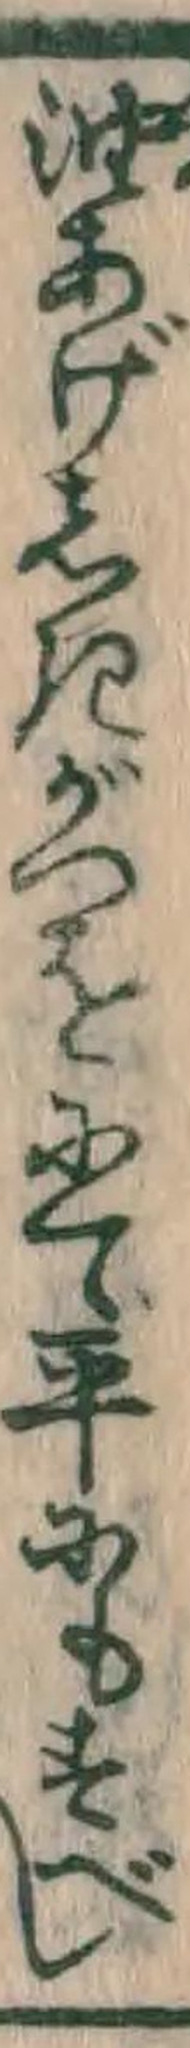油あげしきがつをにて平にもすべし
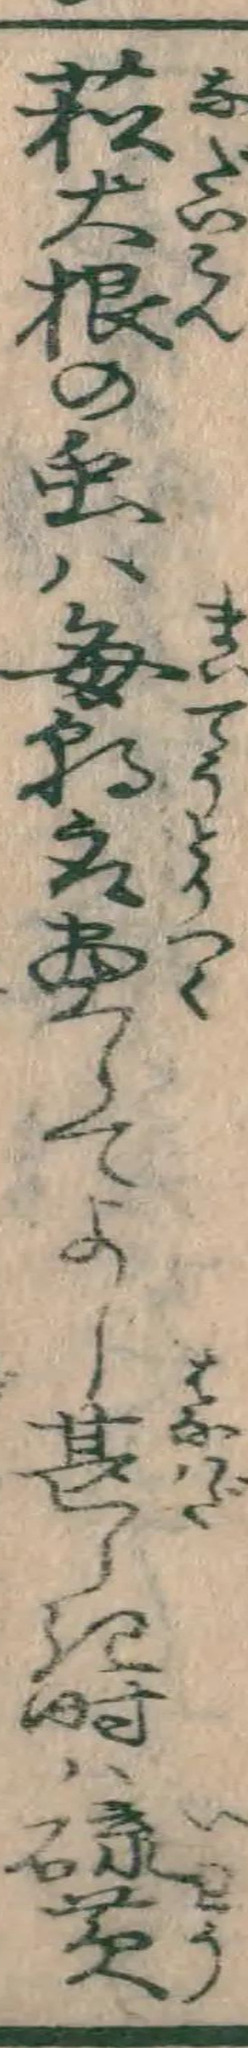菘大根の虫は毎朝取尽してよし甚しき時は硫黄
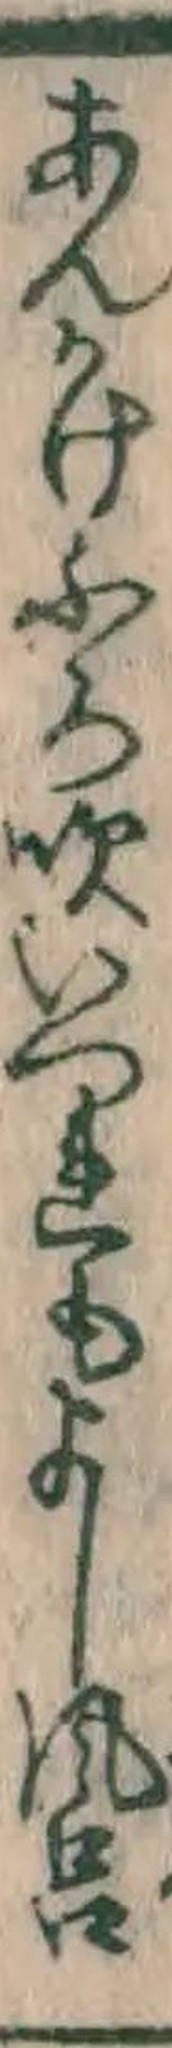あんかけふろ吹いつれもよし風呂
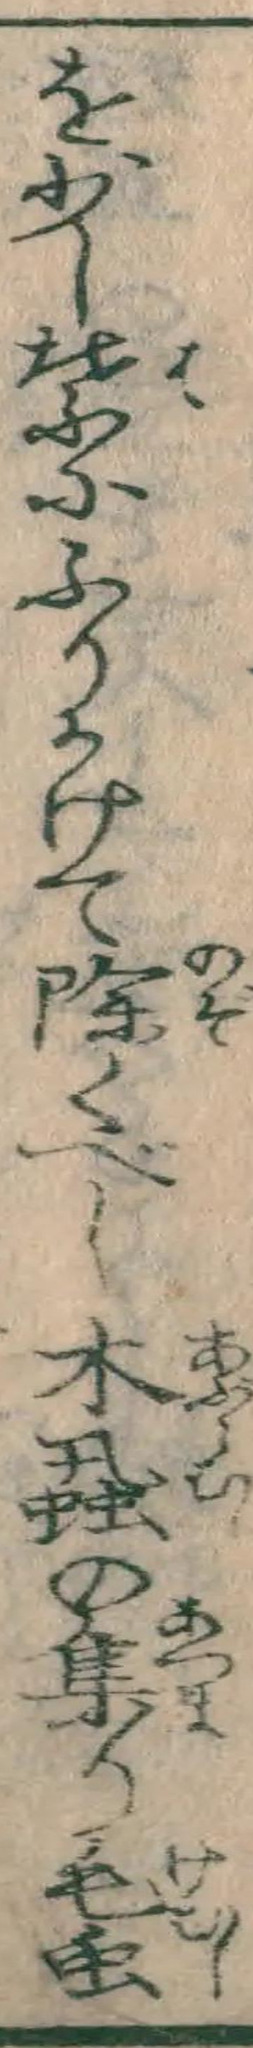を少し葉にふりかけて除くべし木蝨の集り毛虫
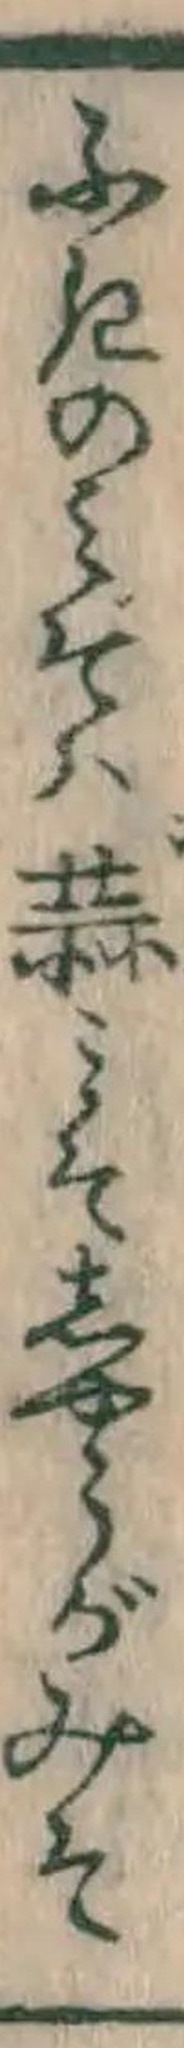ふきのみそは蒜みそしやうがみそ
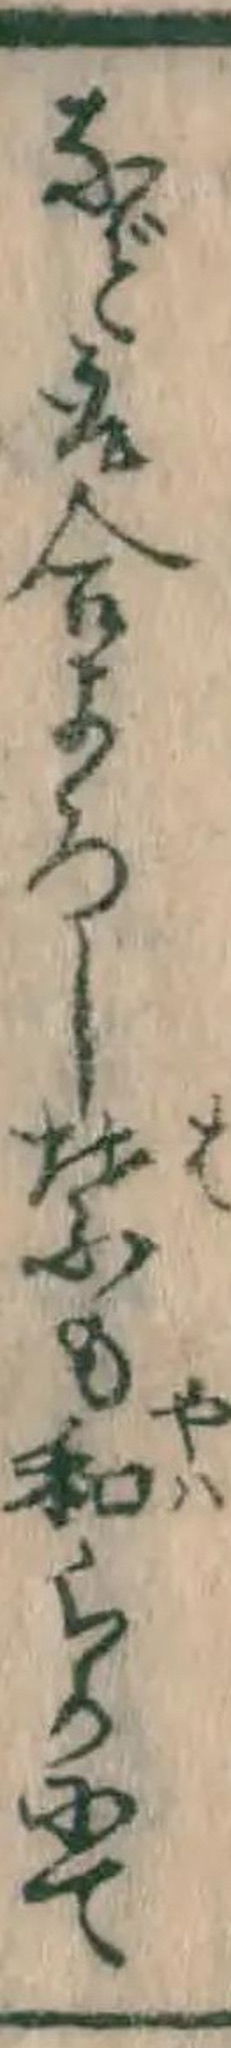など取合よろし葉も和らかにて
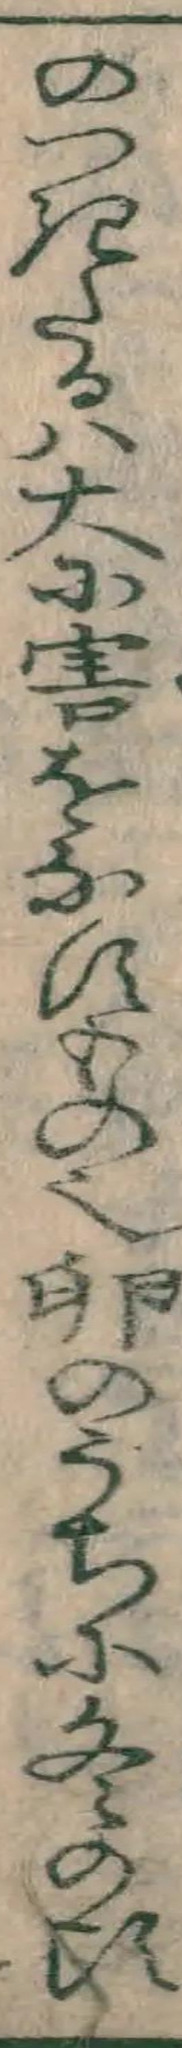のつきたるは大に害をなすもの也卵のうちに冬の頃
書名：広益秘事大全 3巻. [5]
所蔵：国立国会図書館 National Diet Library, JAPAN
